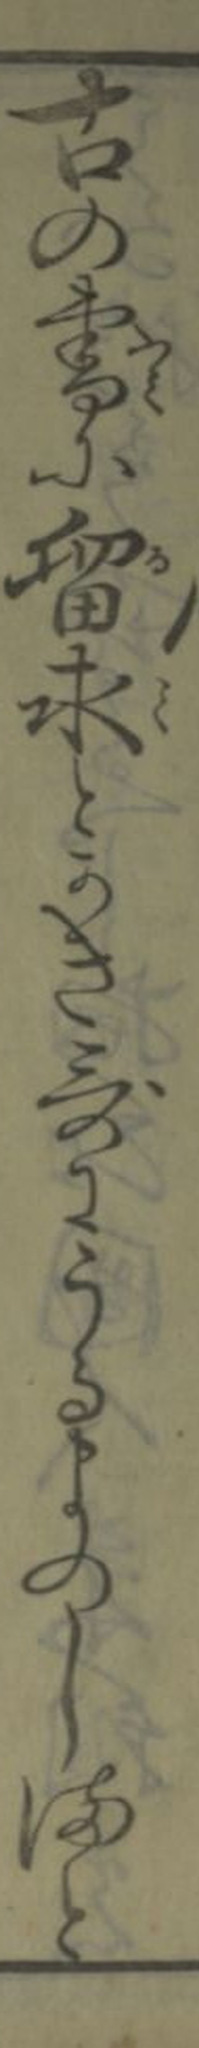古の書に留求とかき哥にうるまのしまと
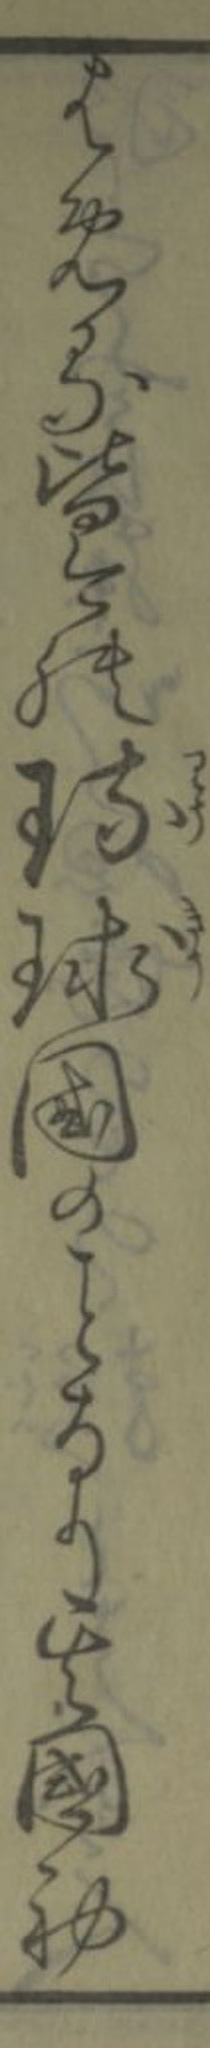よめる皆今の琉球國のことなり其國初
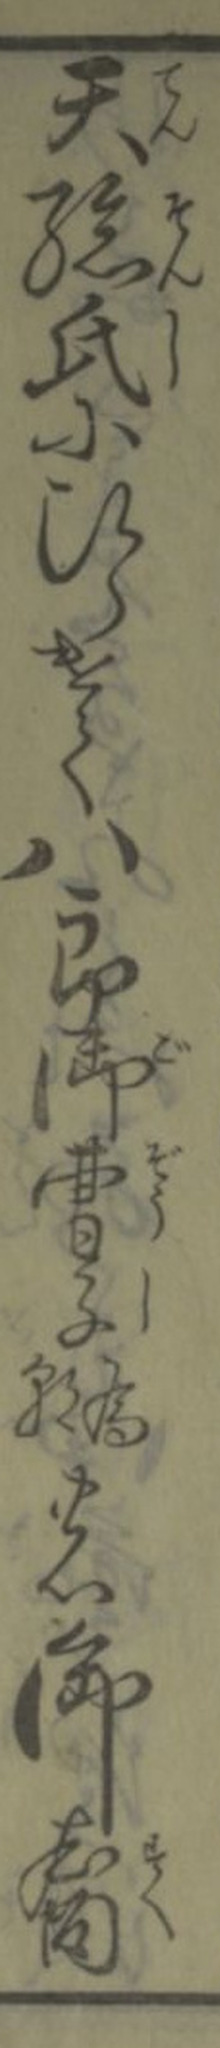天孫氏にひらけて八郎御曹子為朝の御裔
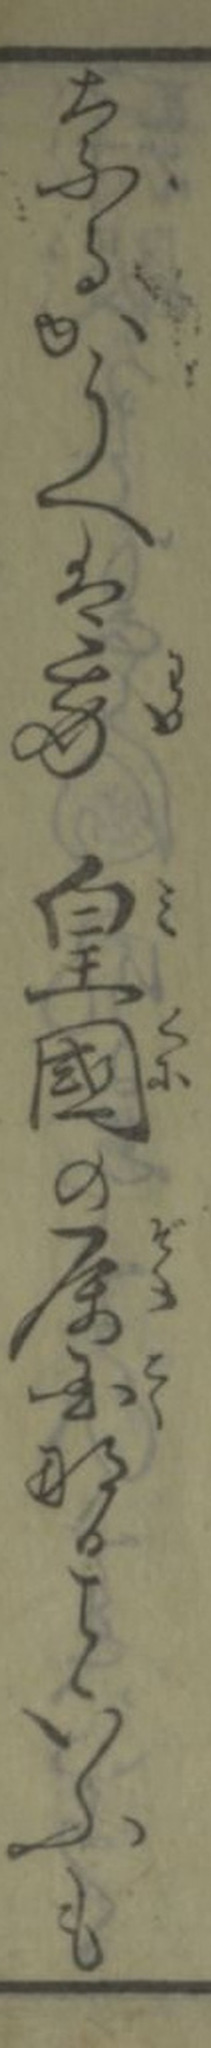なるかうへは我皇國の属国なることいふも
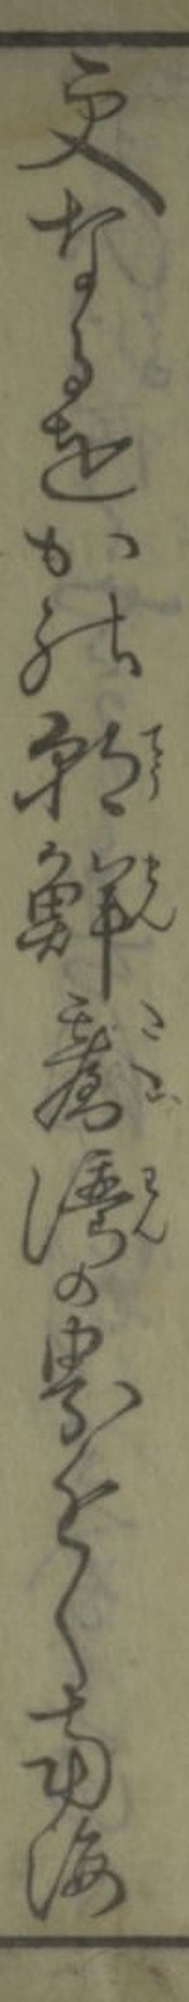更なるをかの朝鮮臺湾の界近く南海
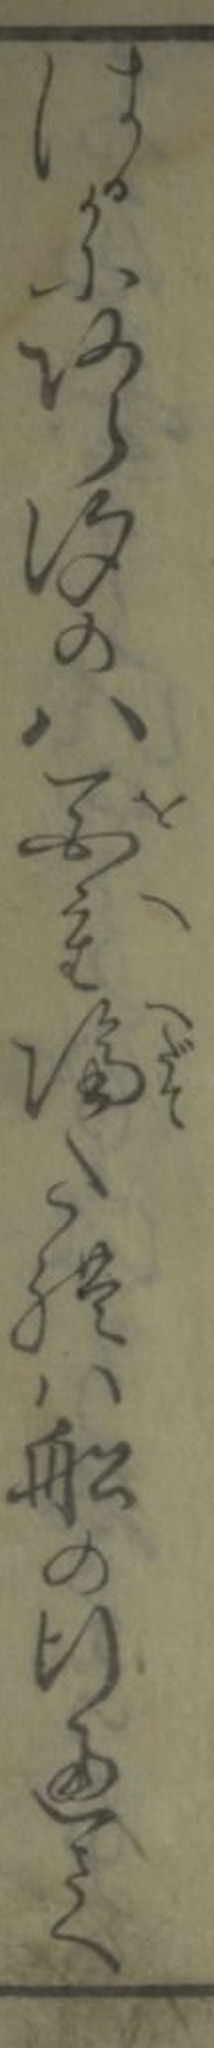はるかにあら汐の八百重隔たれは船の行通さへ

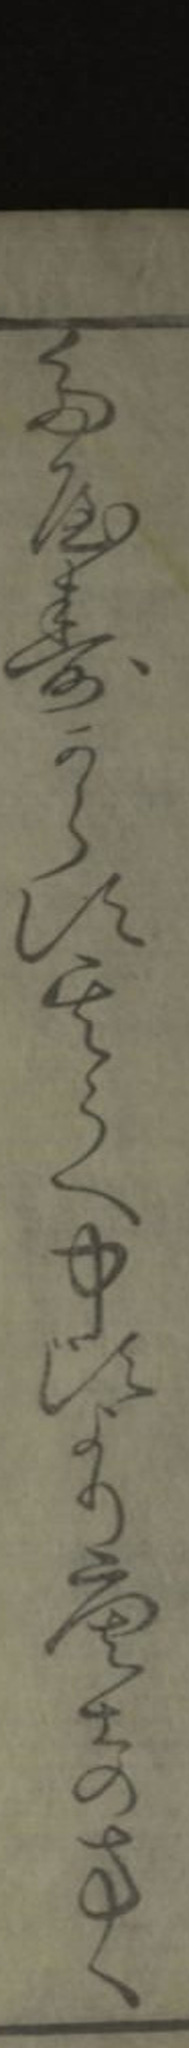たやすからす其うへ中頃より唐土のすく
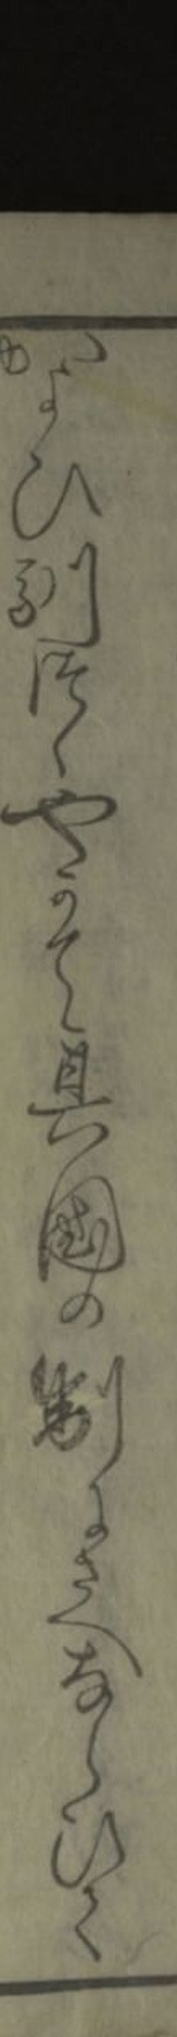かよひ馴つゝやかて其國の制にさへならひて
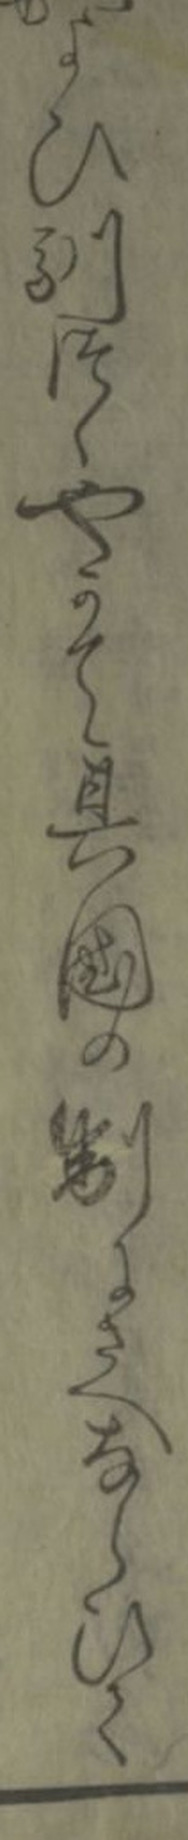かよひ馴つゝやかて其國の制にさへならひて
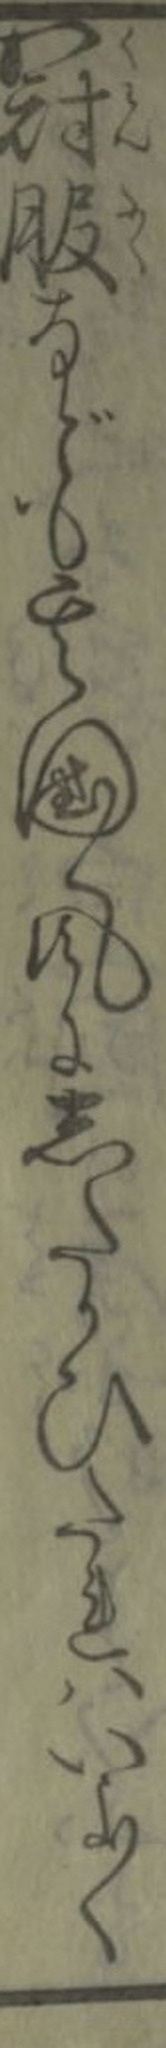冠服なども其國風にしたかひたれはいよ〳〵
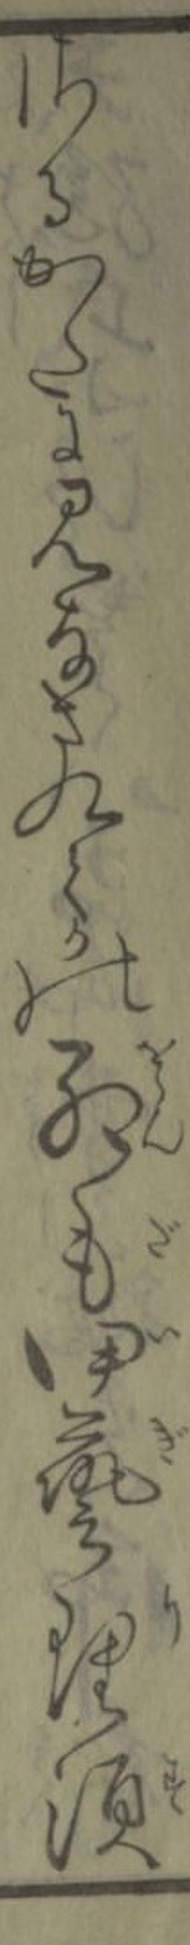さるかたに見なされてかの紅毛伊藝理須
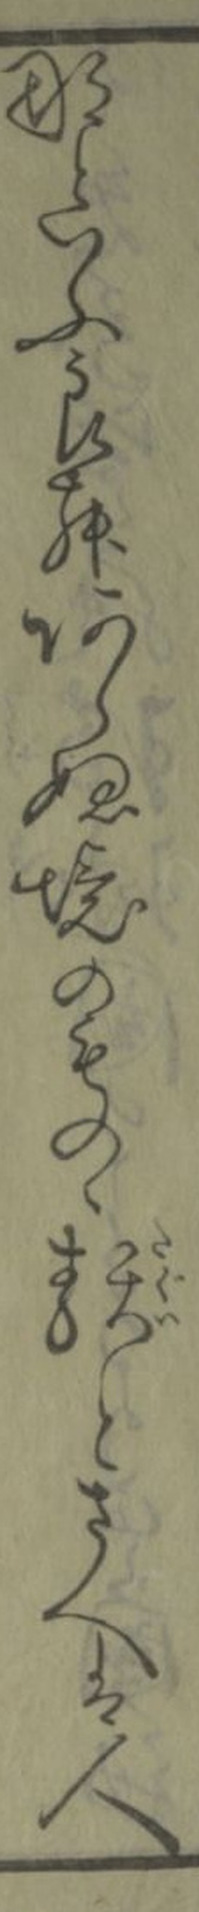なといふらむあらぬ境のものゝ類とさへは人
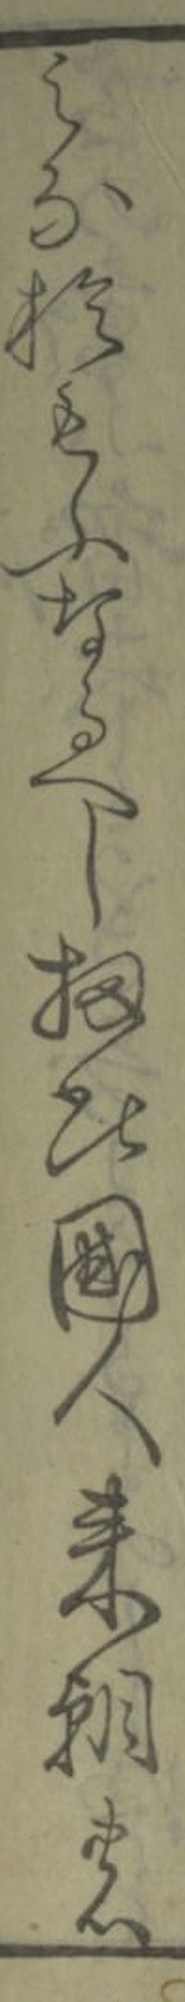みなおもふなるへし扨此國人来朝の
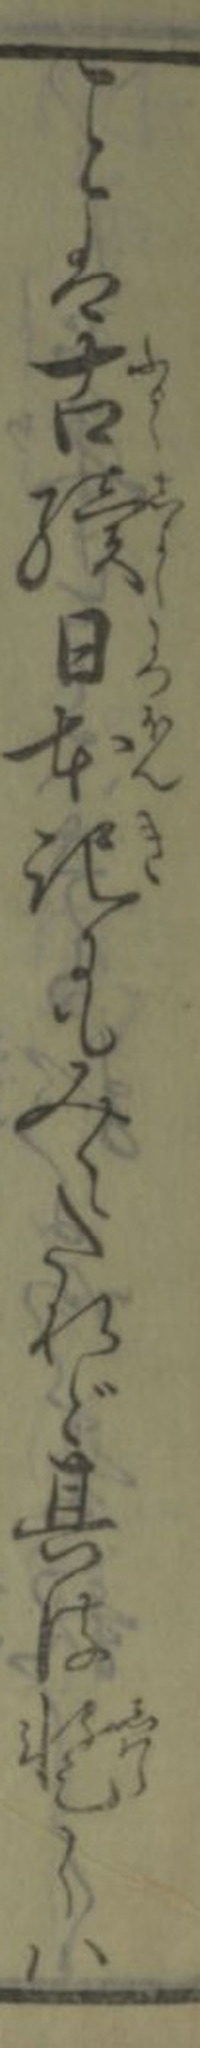ことは古続日本記にもみえたれど其後暫くは
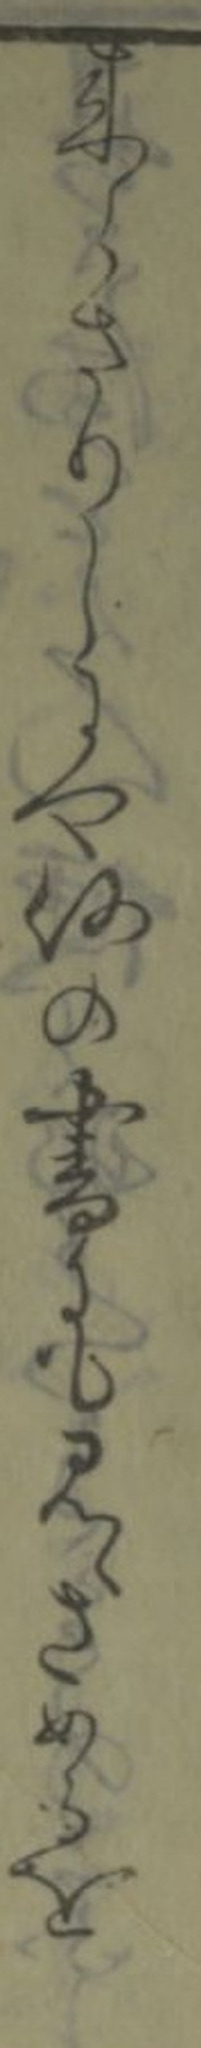来らさりしにや何の書にも見えさめるを
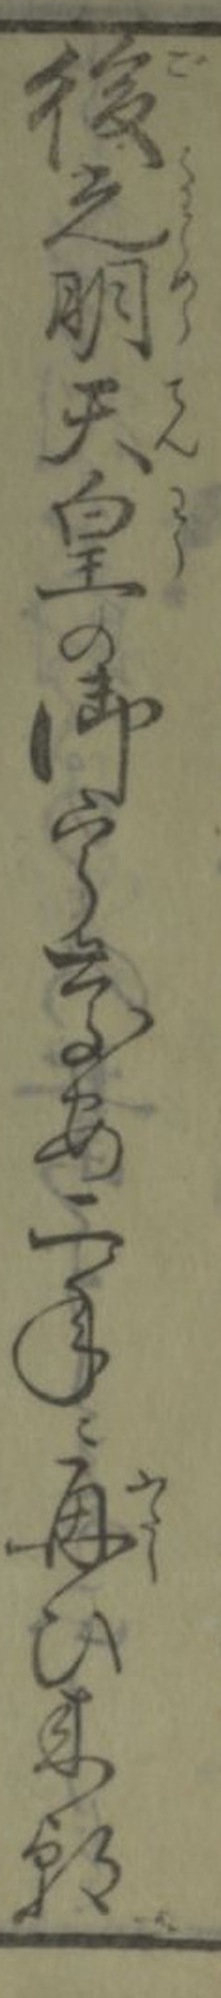後光明天皇の御宇慶安二年に再ひ来朝
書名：琉球人行列記
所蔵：University of the Ryukyus Library
